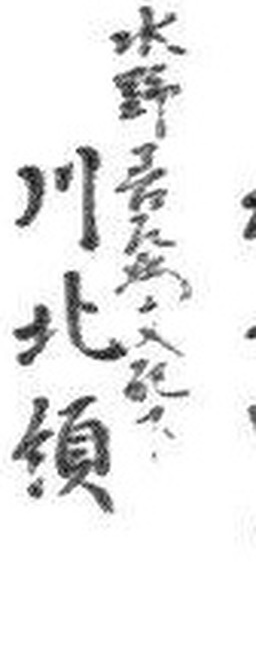川北領
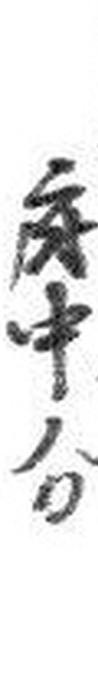府中分
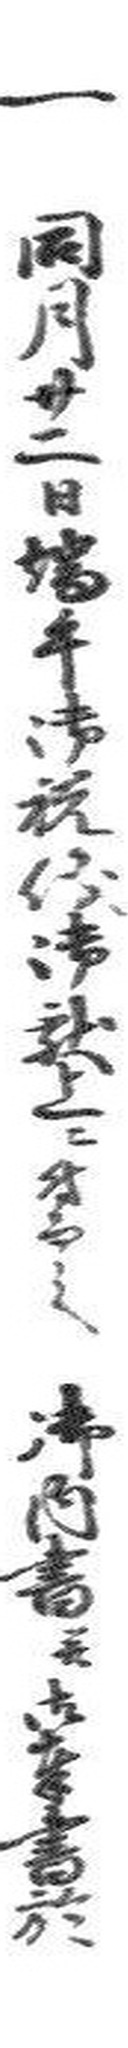一同月廿二日端午御祝儀御献上ニ付而之御内書并御奉書於
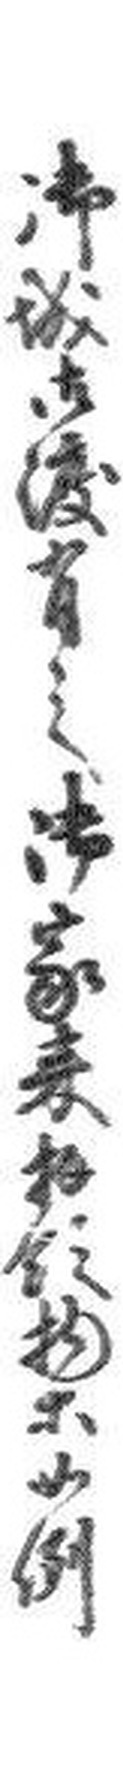御城御渡有之御家来拝領物等如例

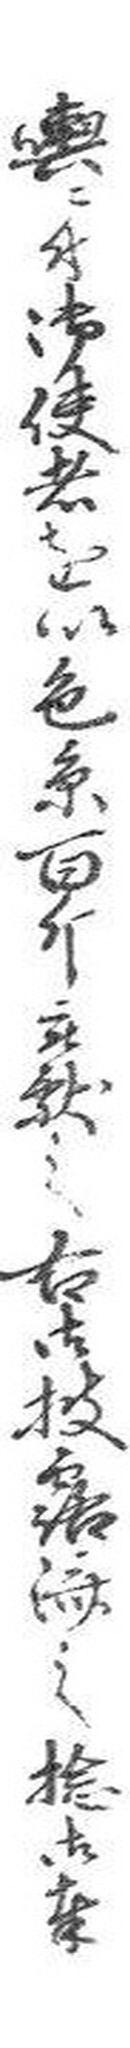輿ニ付御使者を以色糸百斤被献之右御披露済之捻御奉
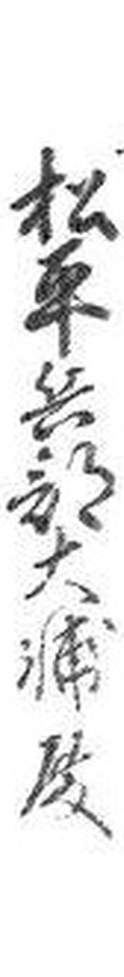松平兵部大輔殿
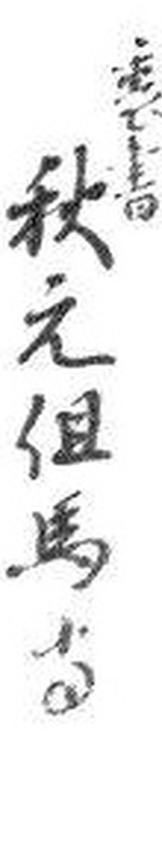秋元但馬守
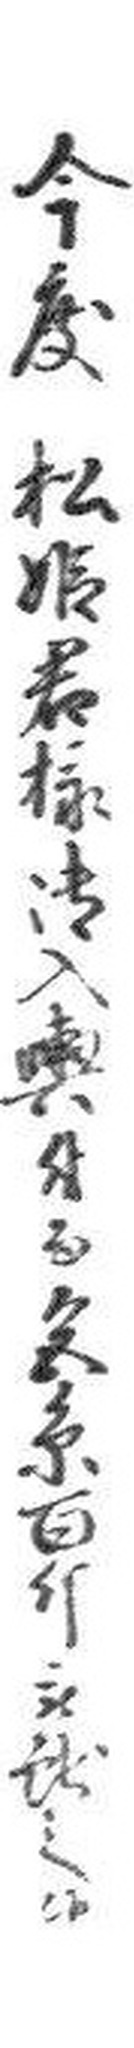今度松姫君様御入輿付而色糸百斤被献之候
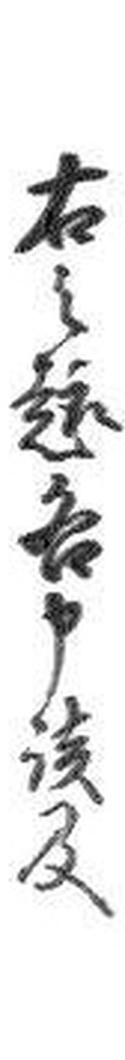右之趣各申談及
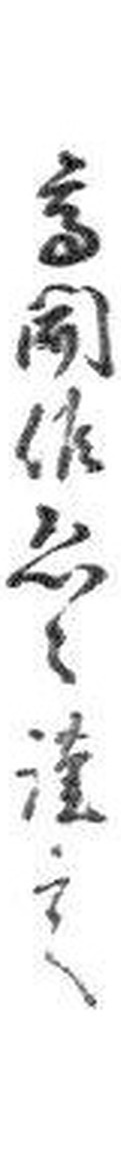高聞候恐々謹言
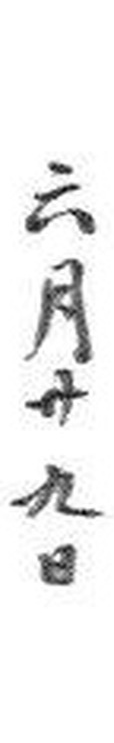六月廿九日
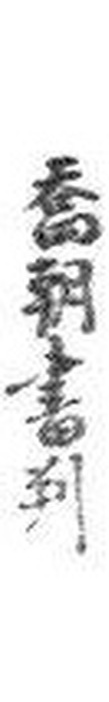喬朝書判
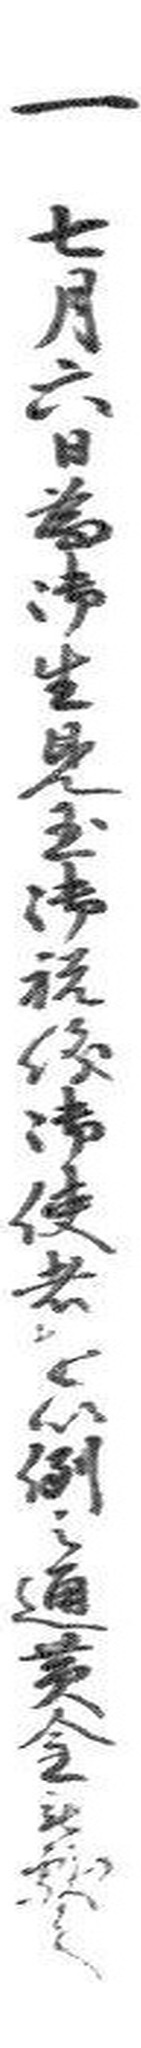一七月六日為御生見玉御祝儀御使者を以例之通黄金被献之
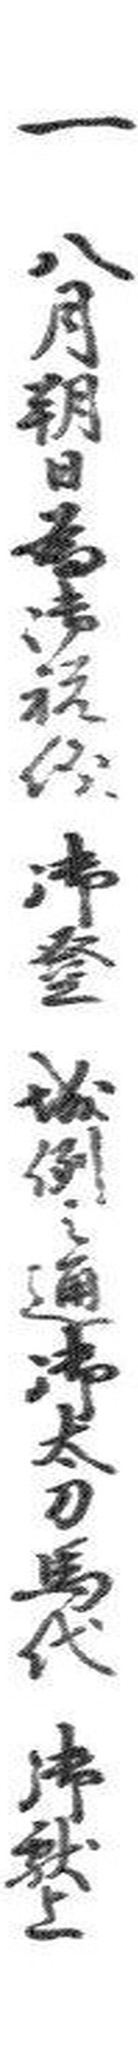一八月朔日為御祝儀御登城例之通御太刀馬代御献上
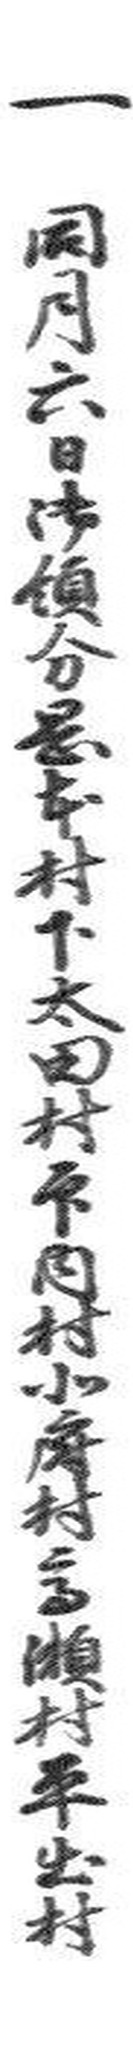一同月六日御領分岡本村下太田村印内村北府村高瀬村平出村
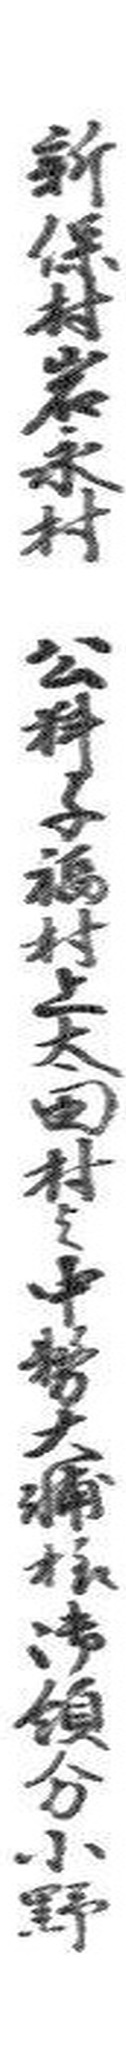新保村岩永村公料千福村上太田村と中務大輔様御領分小野
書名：家譜 二十四 吉品公 従宝永三年到同五年
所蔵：福井県文書館 Fukui Prefectural Archives
